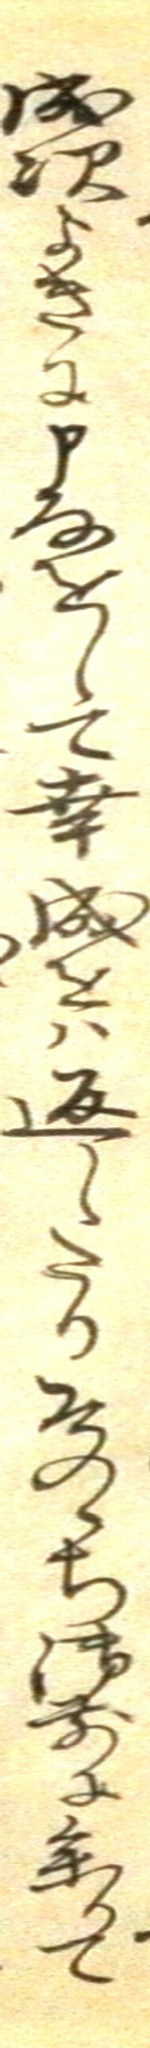成次よきに申なをして幸成をは返したりそのゝち御前に参りて
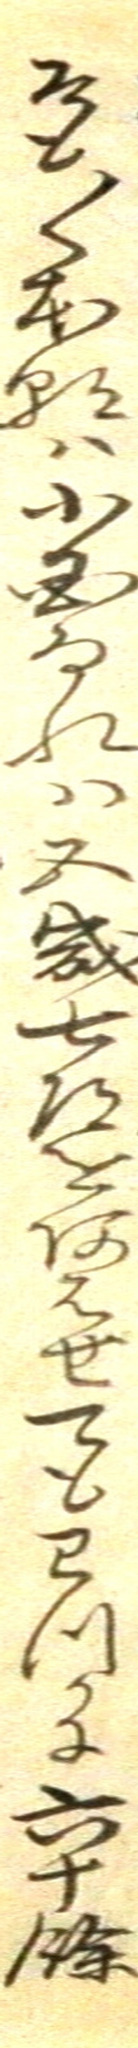そも〳〵本朝は小国なれは五畿七道をあはせてもわつかに六十余
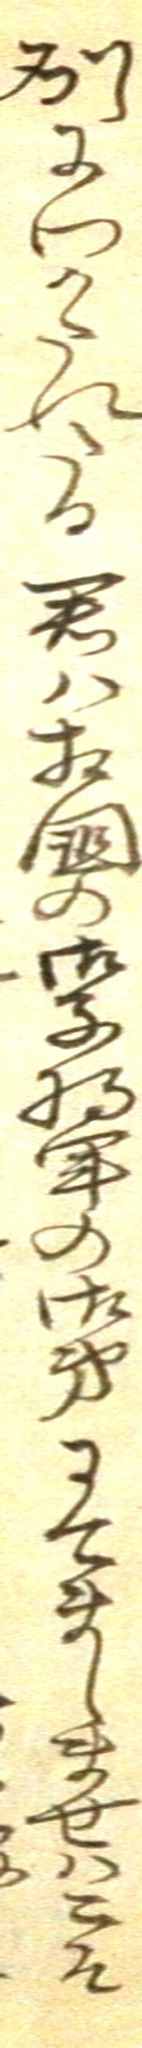州にわかたれたる君は相国の御子将軍の御弟にてましませはこそ
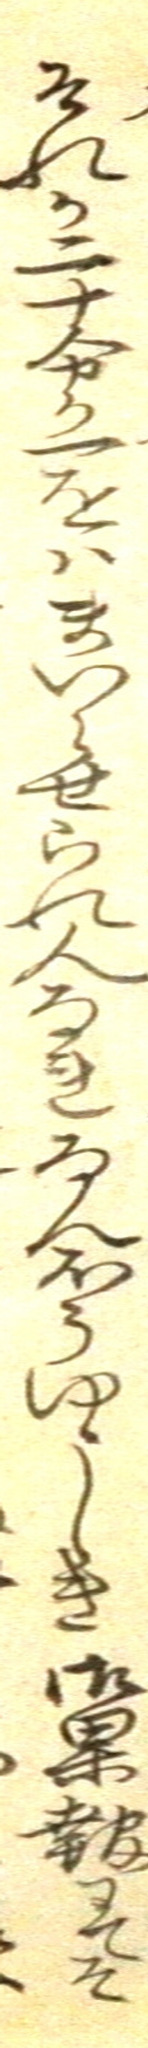それか二十分か一をはまいらせられんなれなんほうゆゝしき御果報にてそ
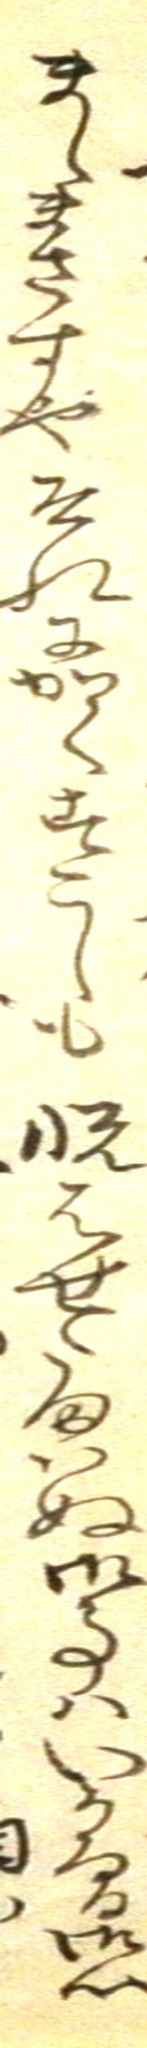ましまさすやそれにかくすこしも悦はせたまはぬ御事はいかなる御心
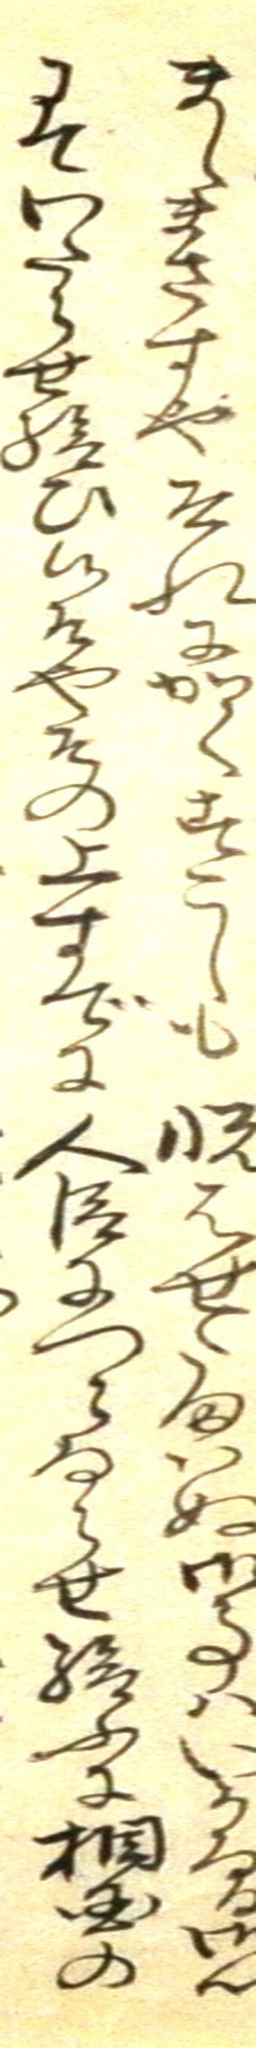にてわたらせ給ひ候そやその上すでに人臣につらならせ給ふに相国の
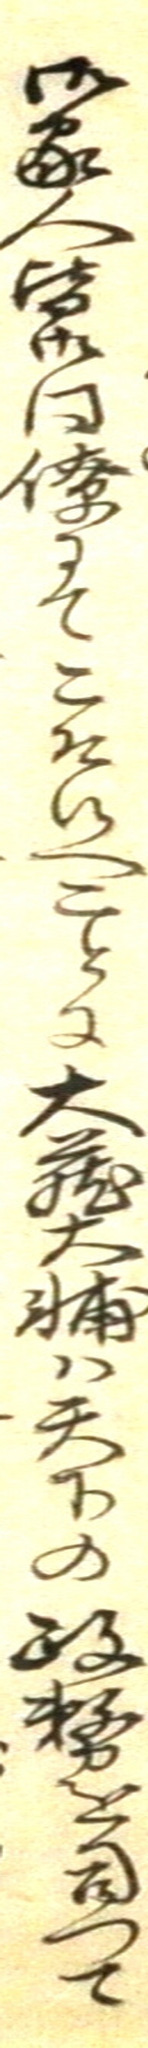御家人皆御同僚にてこそ候へことに大蔵大輔は天下の政務を司つて
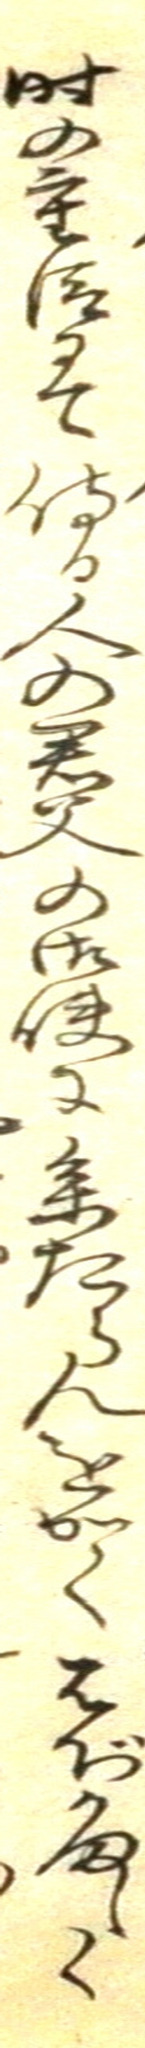時の重臣にて侍る人の君父の御使に参たらんをかくはぢかましく
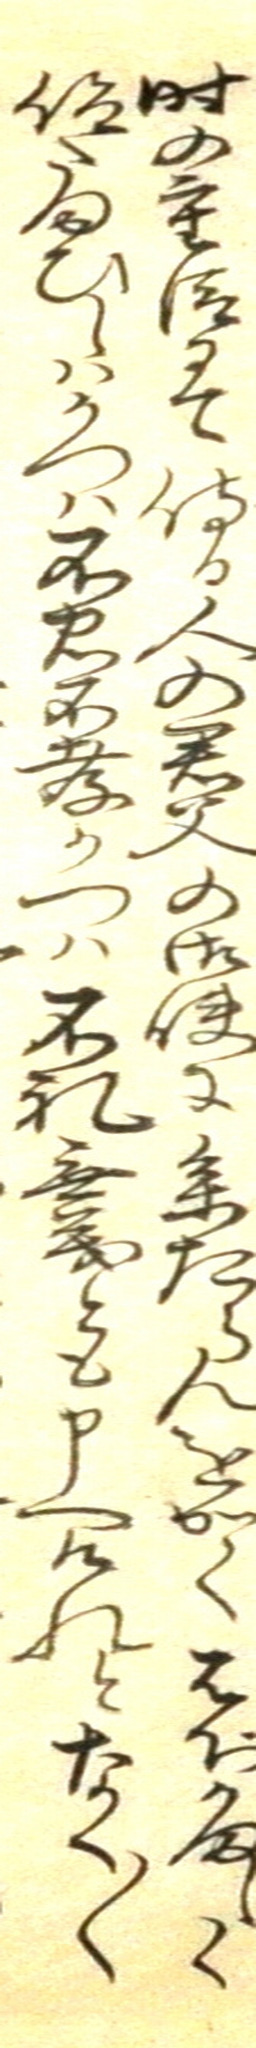仰たまひしはかつは不忠不孝かつは不礼無義とも申へけれとなく〳〵
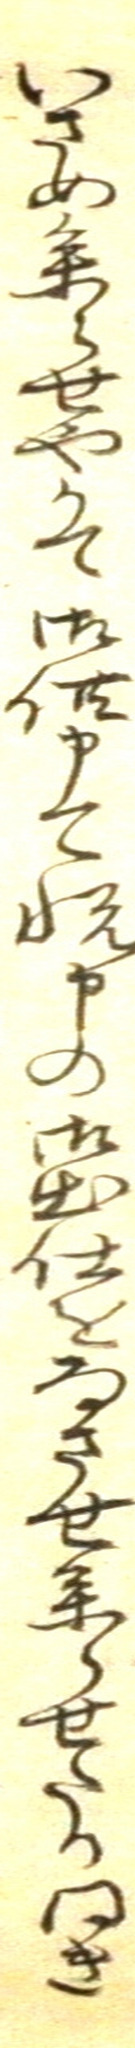いさめ参らせやかて御供申て悦申の御出仕をなさせ参らせたり同き
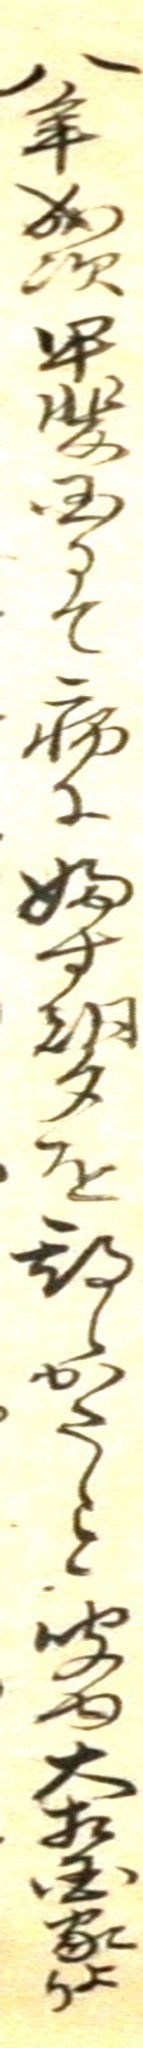八年成次甲斐国にて病にふす朝夕を期しかたしと聞ゆ大相国家より
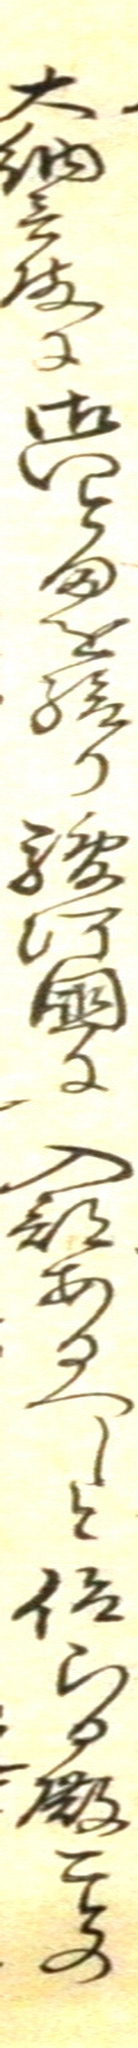大納言殿に御いとまを給り駿河国に入部あるへしと仰せらる殿ことの
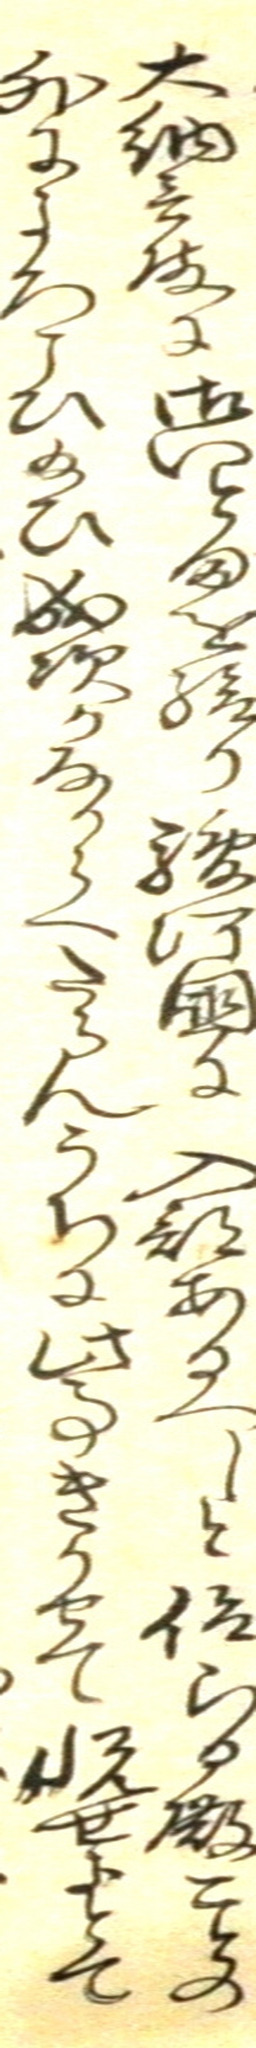外によろこひ給ひ成次かなからへたらんうちに此事きかせて悦せよとて
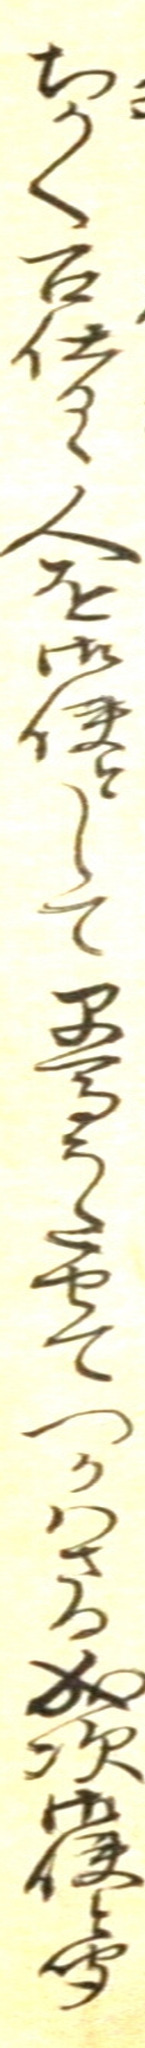ちかく召仕るゝ人を御使として早馬うたせてつかはさる成次御使と聞
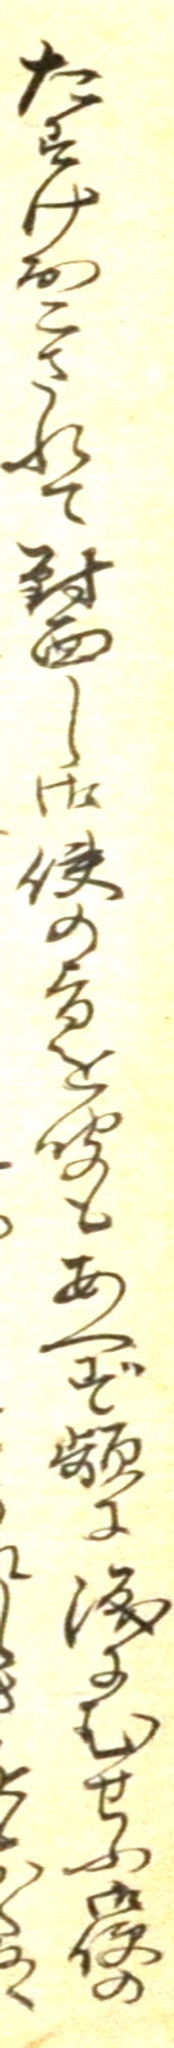たすけおこされて対面し御使の旨を聞もあへず頻に涙にむせふ御使の
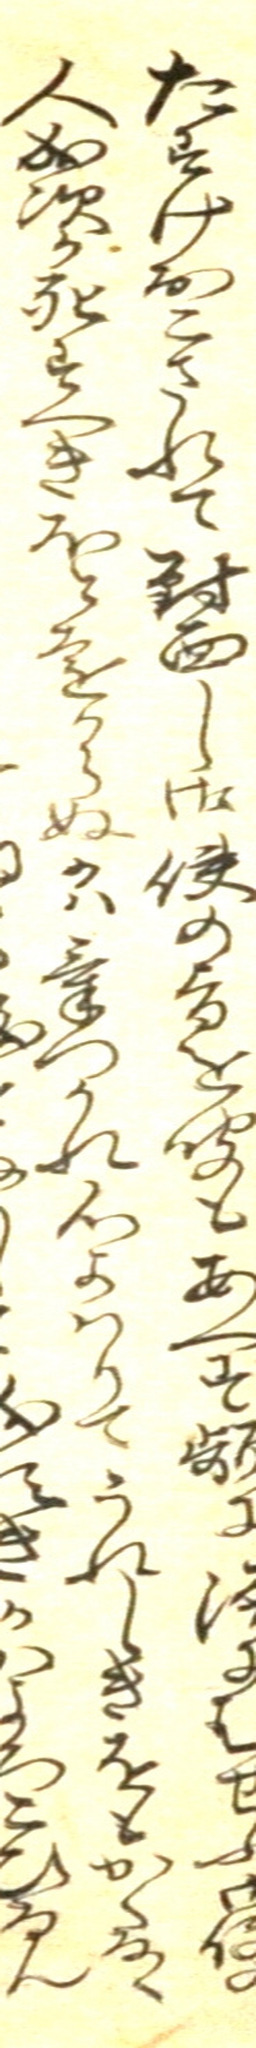人成次か死すへきほと遠からぬかは気つかれ心よはりてうれしきをもかくなく
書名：藩翰譜（四・中）
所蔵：伊那市立高遠町図書館・合同会社AMANE
